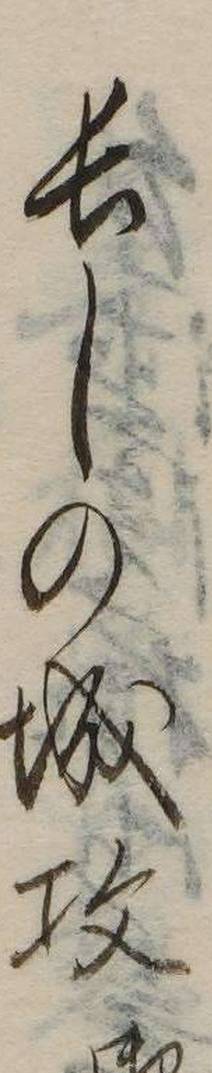たかの城攻
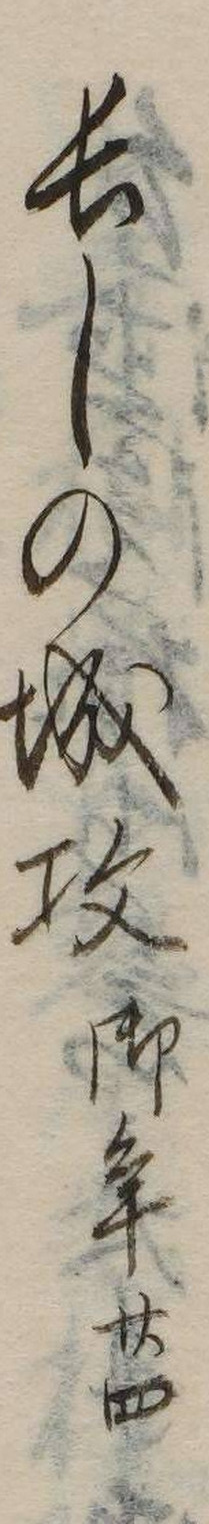長しの城攻御年廿四
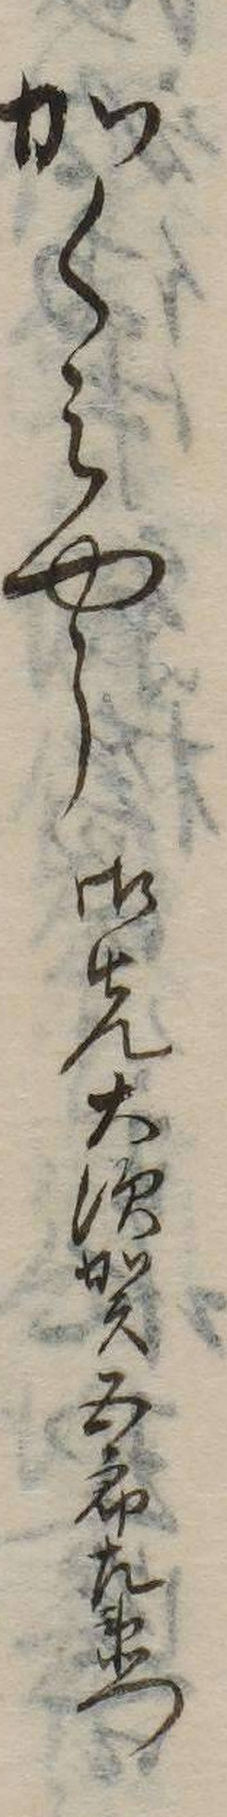かくみやう御先大須賀五郎左衛門
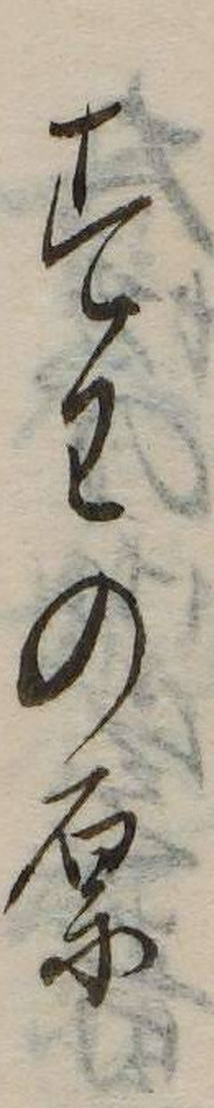すわの原
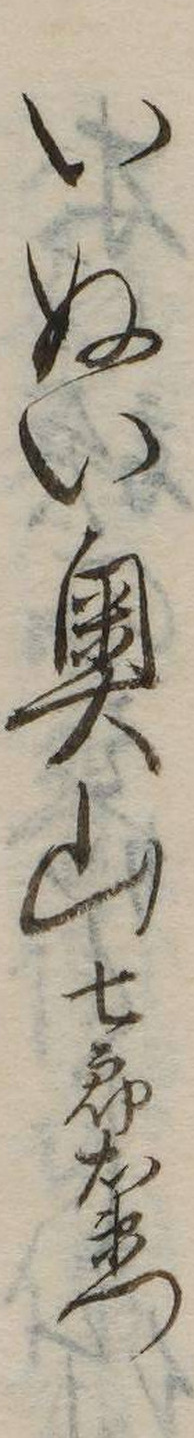いぬい奥山七郎右衛門
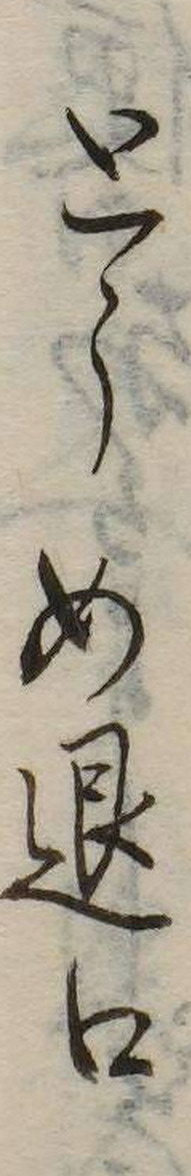とうめ退口
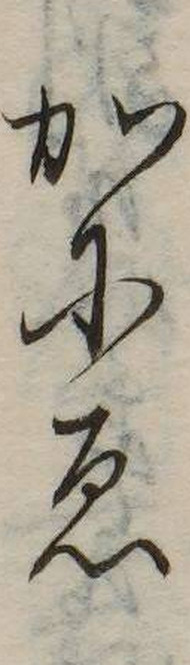かにゑ
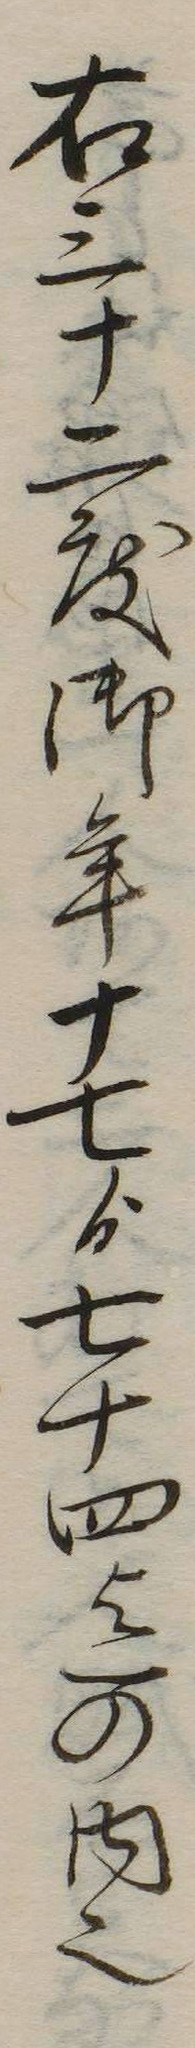右三十二度御年十七ゟ七十四迄の内也
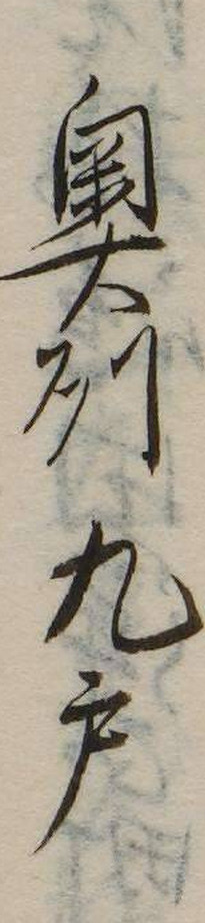奥州九戸
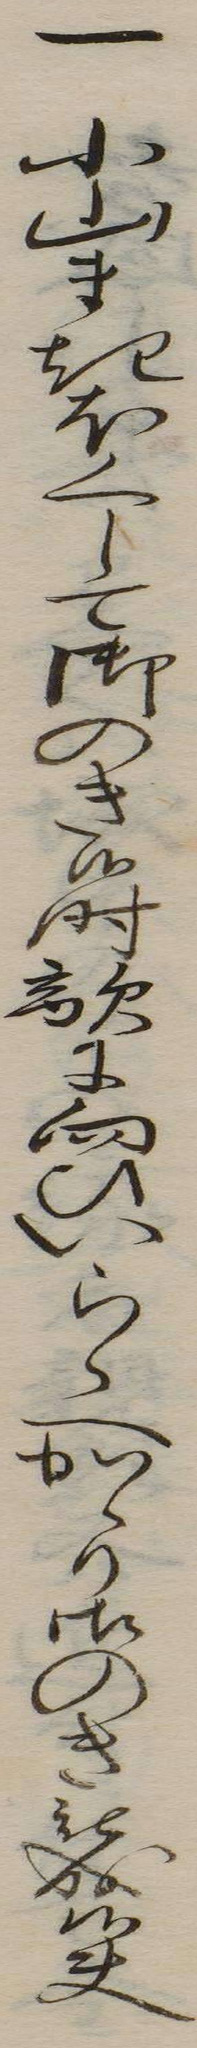小山まきほくして御のき候時敵に向ひいらゝへかゝり候のき被成候夫
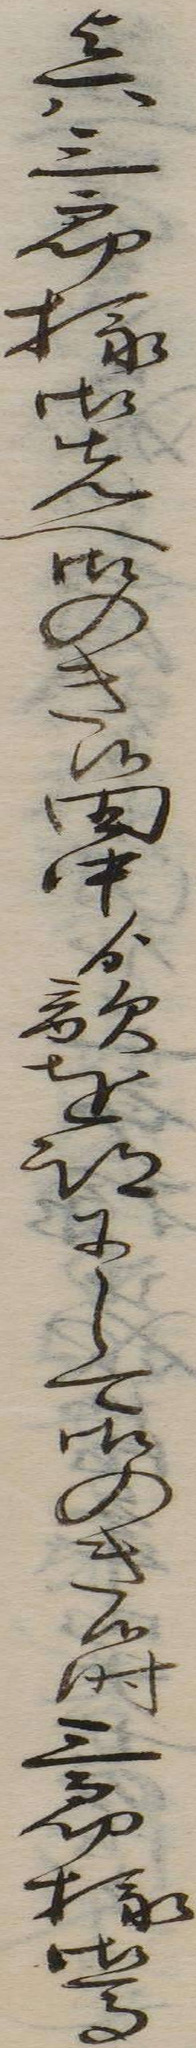迄は三郎様御先へ御のき候田中ゟ敵を跡にして御のき候時三郎様御馬
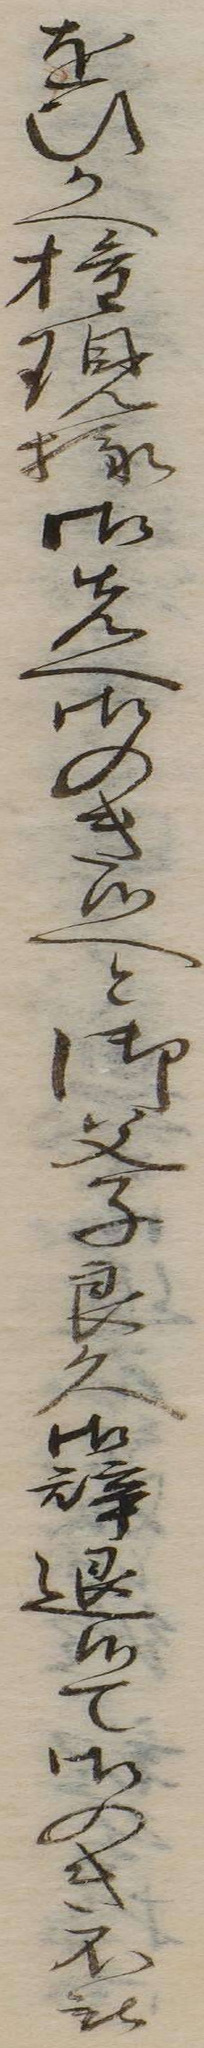をひかへ権現様御先へ御のき候へと御父子良久御辞退候て御のき不被

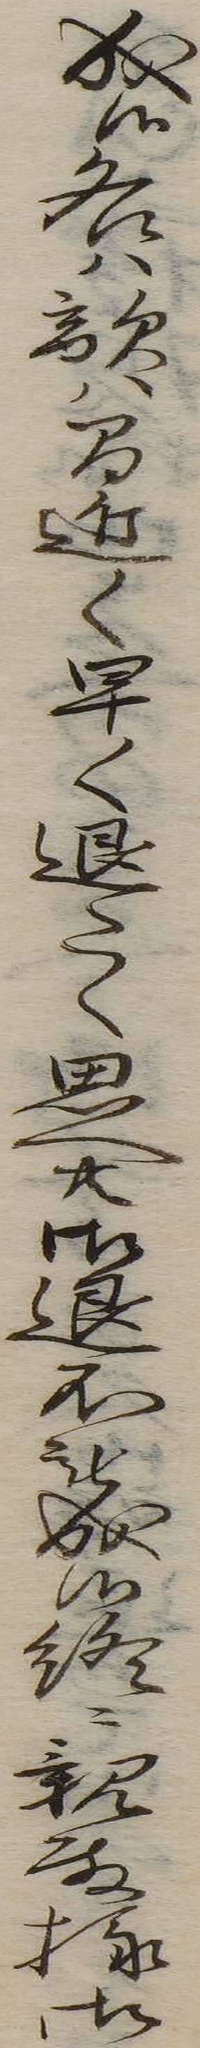成候各は敵は間近く早く退たく思へ共御退不被成候終に親殿様御
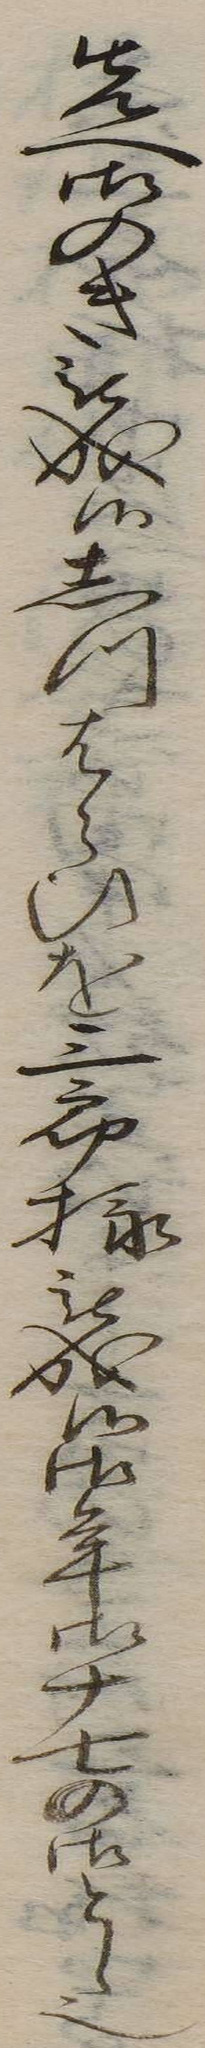先へ御のき被成候しつはらひを三郎様被成候御年御十七の御とし也
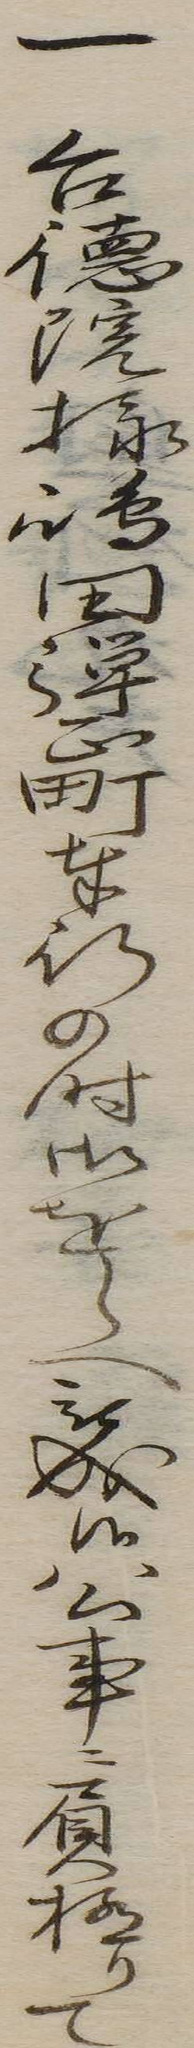一台徳院様嶋田弾正町奉行の時御をしへ被成候公事に負極りて
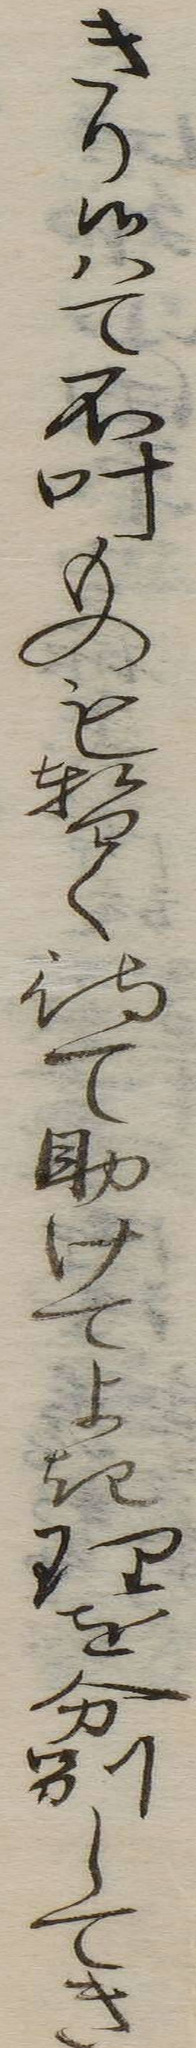きり候はて不叶ものも暫く待て助けてよき理を分別してき
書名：三河之物語
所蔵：国文学研究資料館
